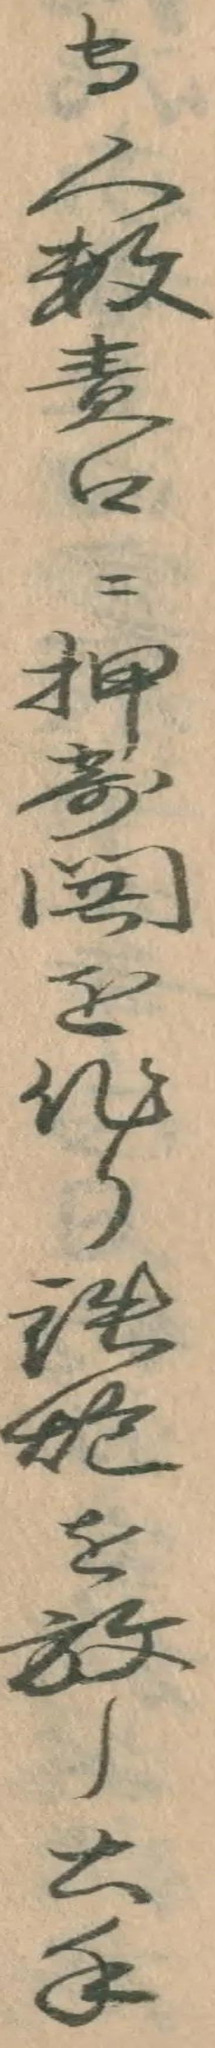守人数責口に押寄鬨を作り鉄炮を放し土手
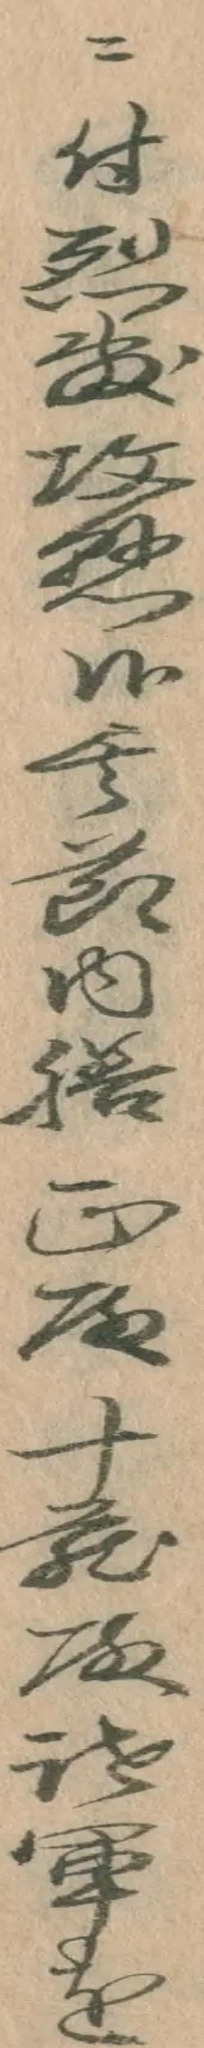に付烈敷攻懸候其節内膳正殿十蔵殿諸軍を
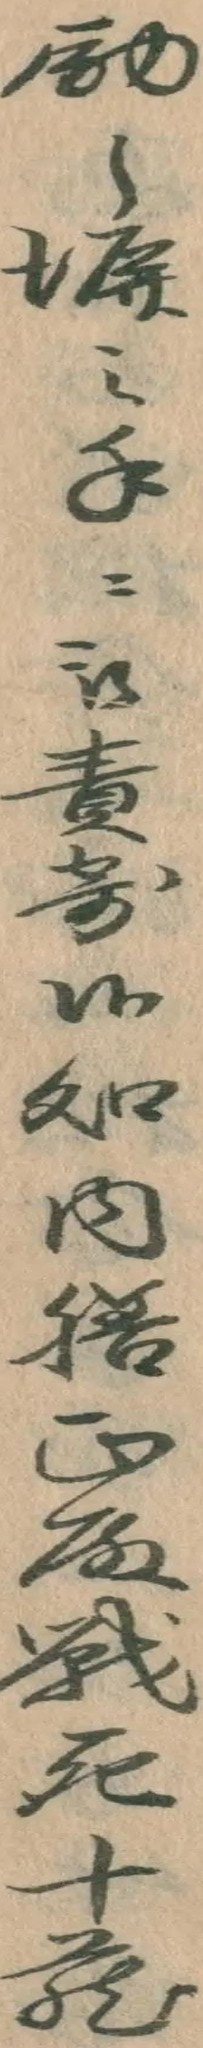励し塀之手に被責寄候処内膳正殿戦死十蔵
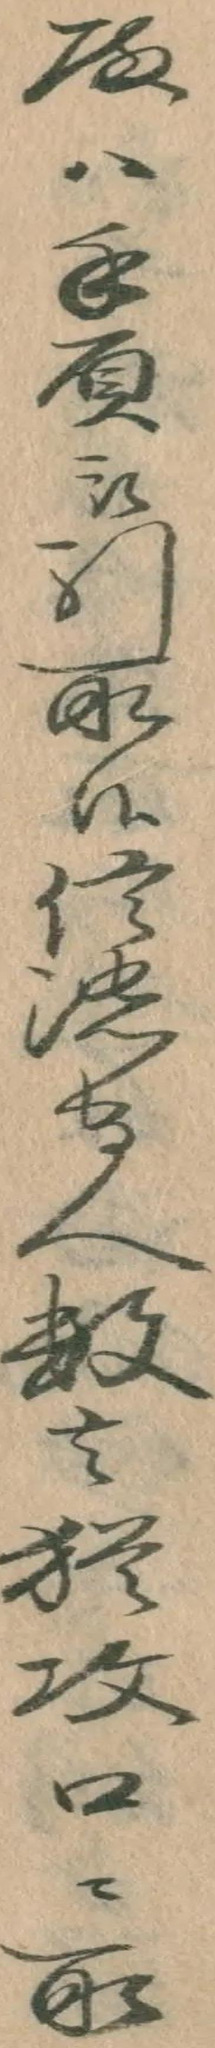殿は手負被引取候信濃守人数者猶攻口に取
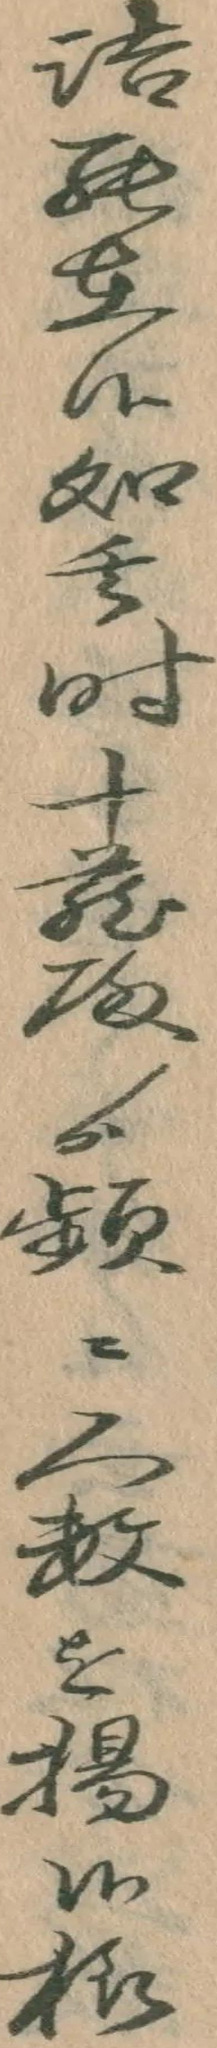詰罷在候処其時十蔵殿ゟ頻に人数を揚候様
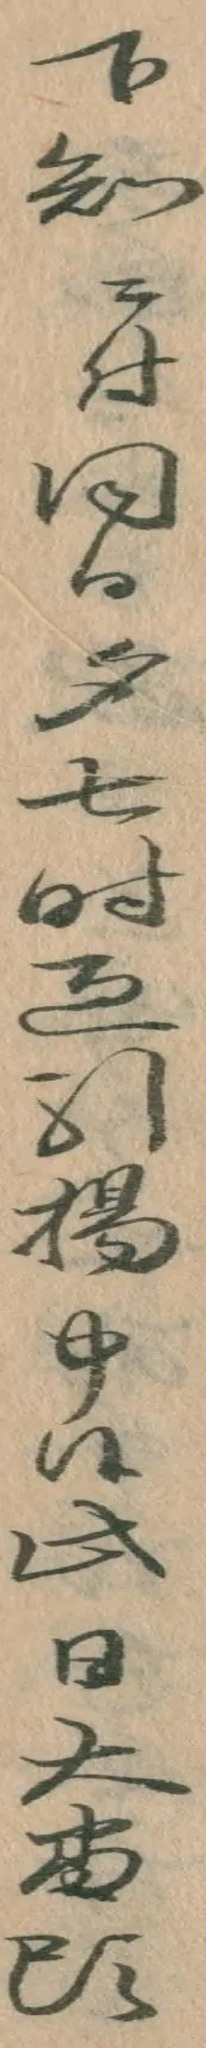下知に付同日夕七時過引揚申候此日大番頭
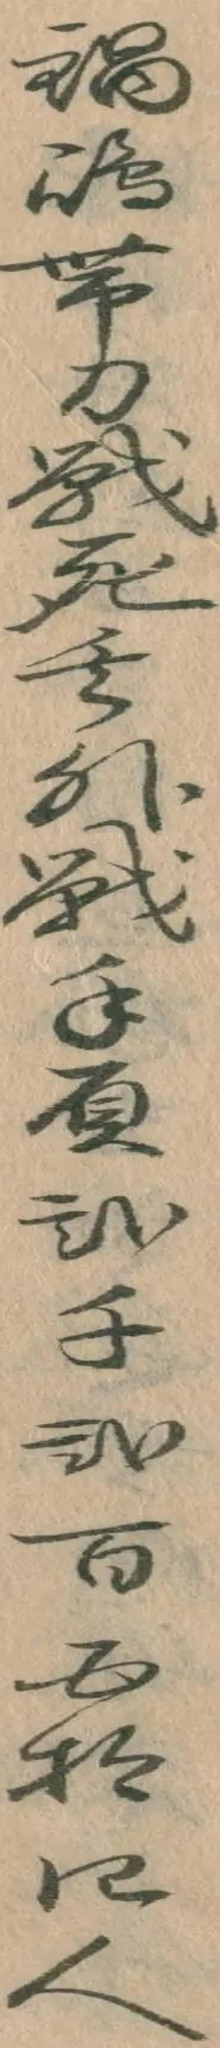鍋島帯刀戦死其外戦手負弐千弐百五拾四人
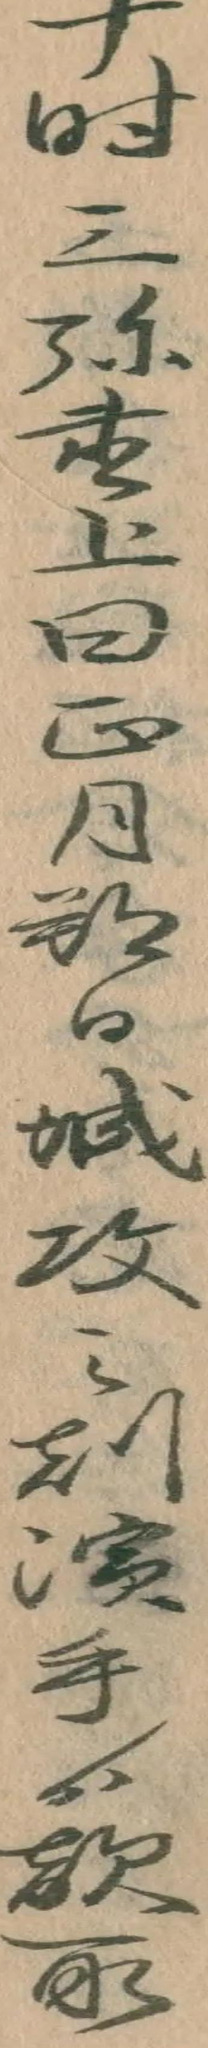十時三弥書上曰正月朔日城攻之刻浜手ゟ敵取
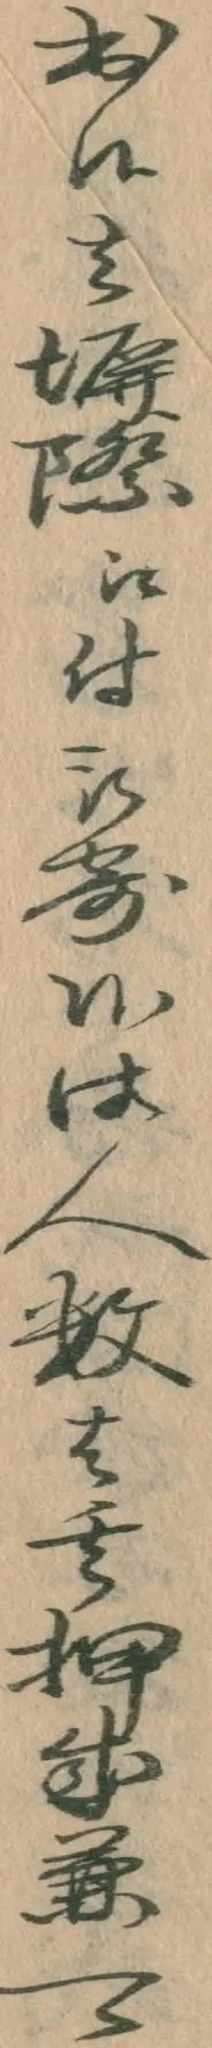出候者塀際江付被寄候御人数者其押成兼可
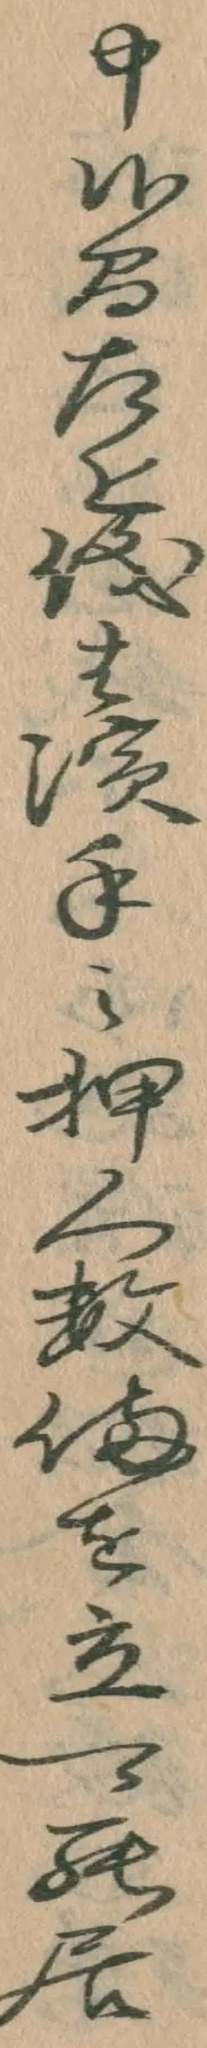申候間左近儀者浜手之押人数備を立可罷居
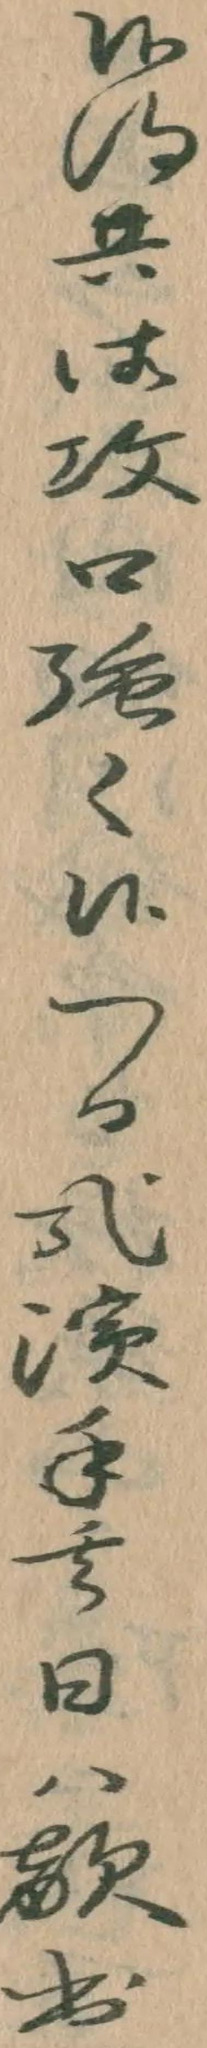候得共御攻口強く候つる哉浜手其日は敵出
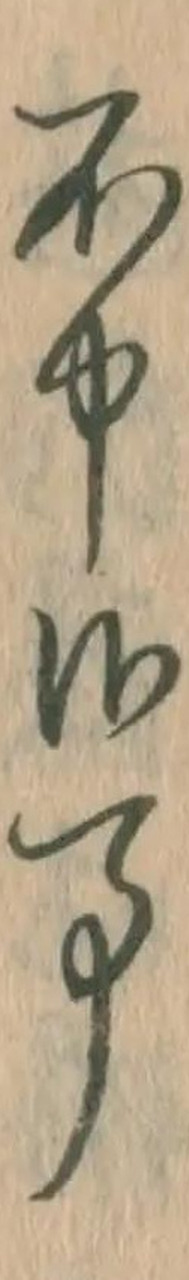不申候事
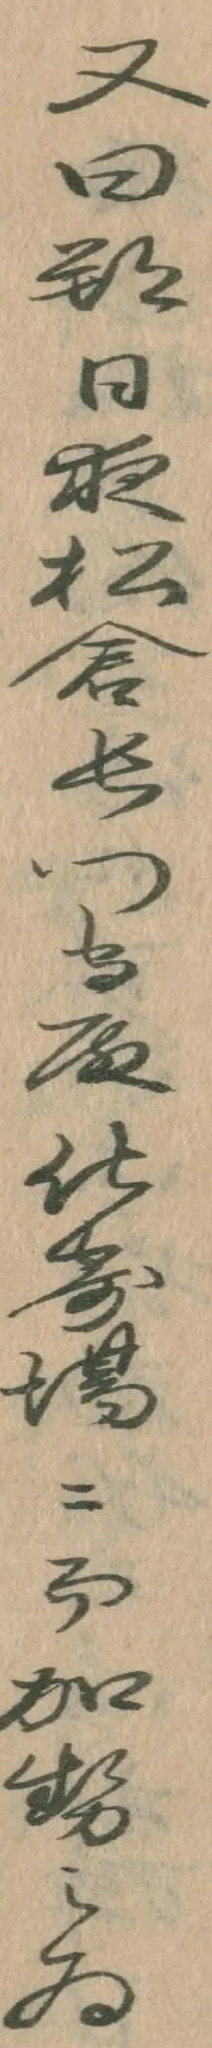又曰朔日夜松倉長門守殿仕寄場に而加勢之ゐ
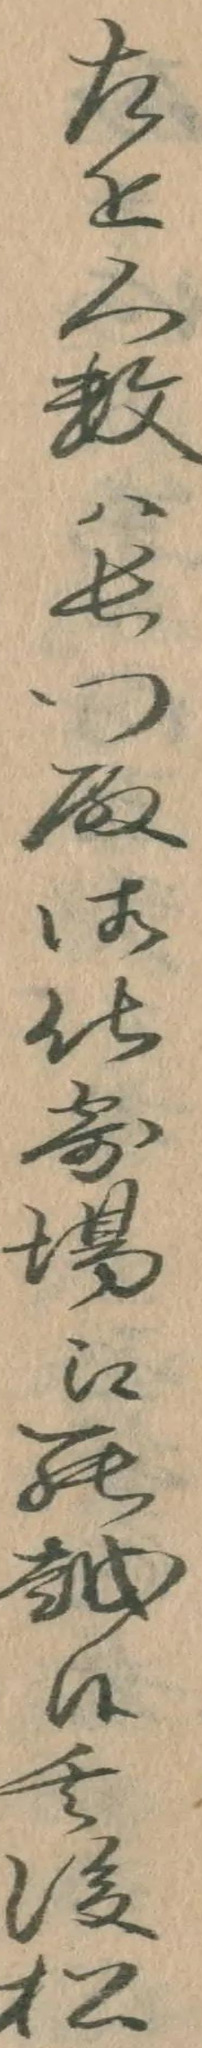左近人数は長門殿御仕寄場江罷越候其後松
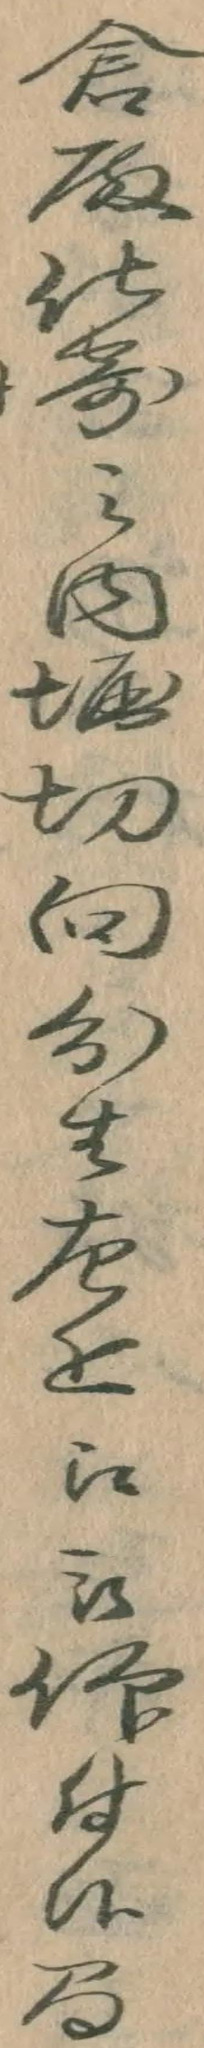倉殿仕寄之内膳切向分者左近江被仰付候間
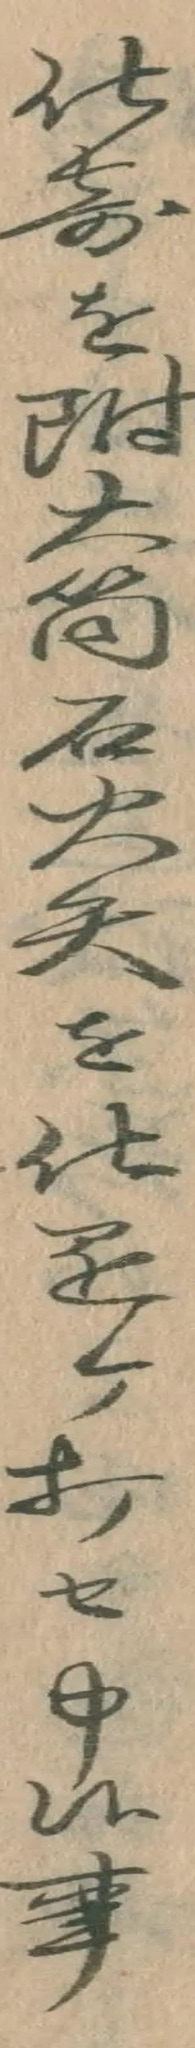仕寄を付大筒石火矢を仕懸け打せ申候事
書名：切支丹御退治記 49巻. [5]
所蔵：国立国会図書館 National Diet Library, JAPAN
